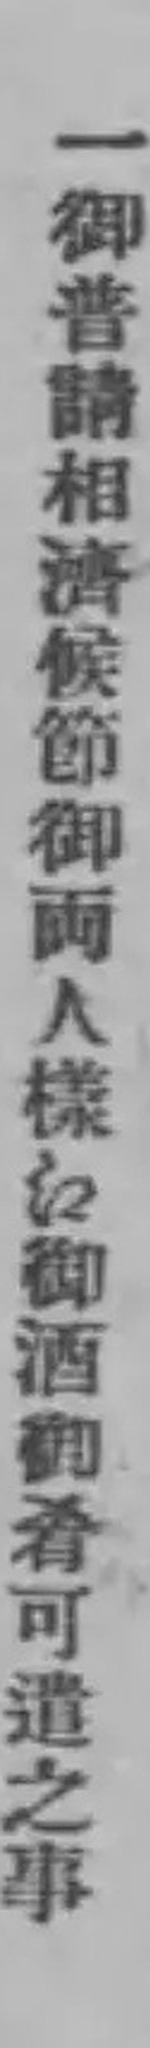一御普請相済候節御両人様え御酒御肴可遣之事
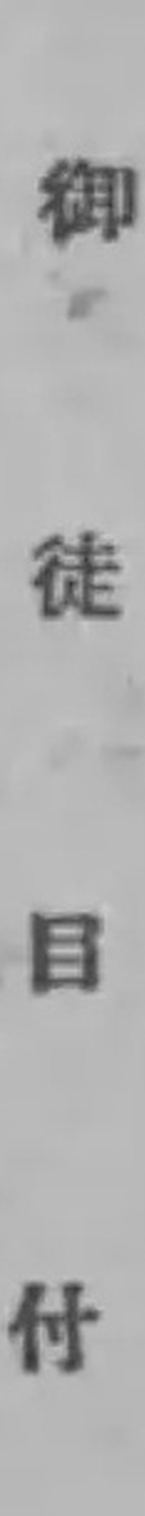御徒目付
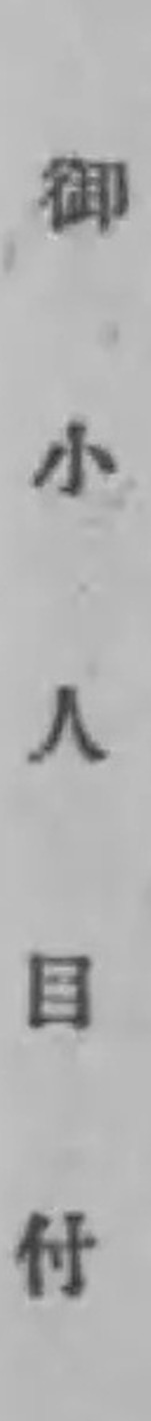御小人目付
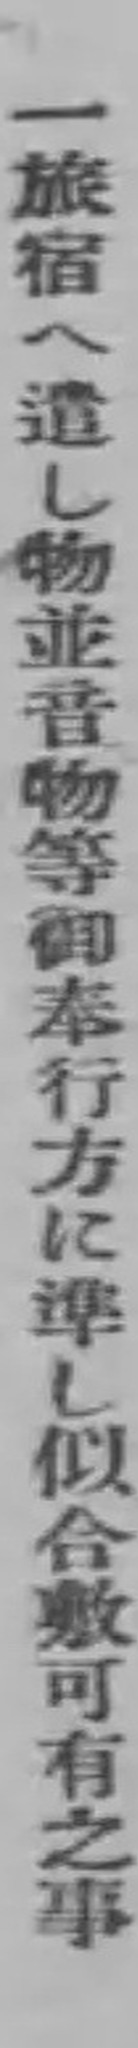一旅宿へ遣し物並音物等御奉行方に準し似合敷可有之事
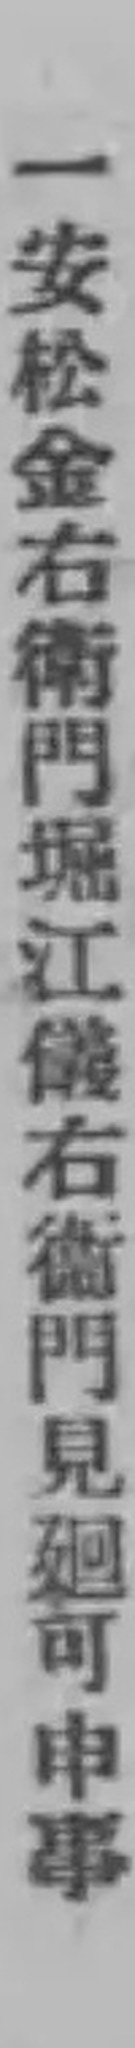一安松金右衛門堀江儀右衛門見廻可申事
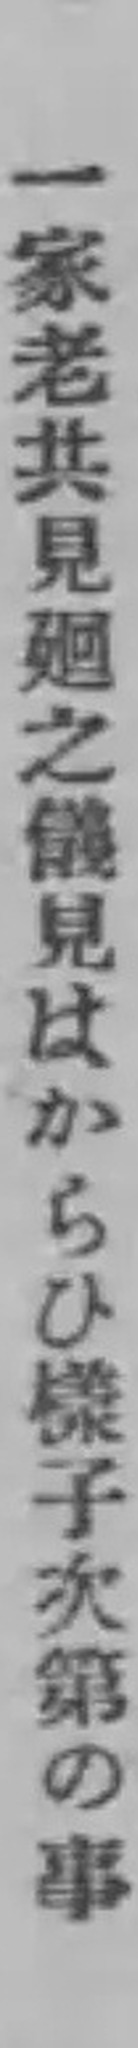一家老共見廻之儀見はからひ様子次第の事
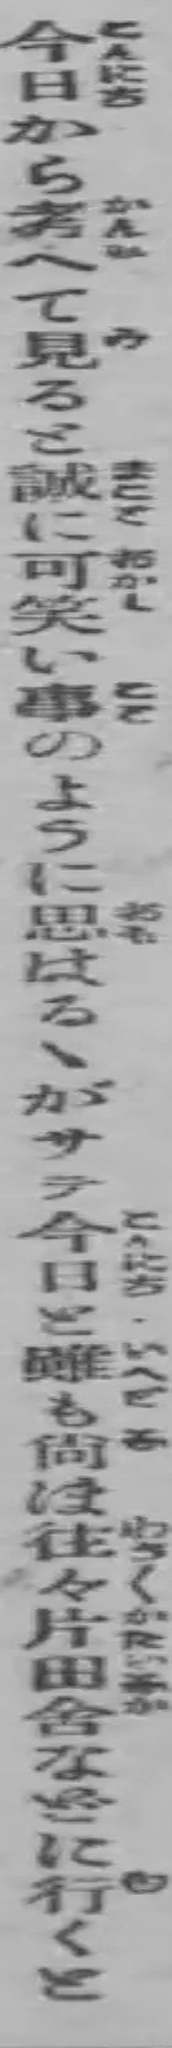今日から考へて見ると誠に可笑い事のように思はるゝがサテ今日と雖も尚ほ往々片田舎などに行くと
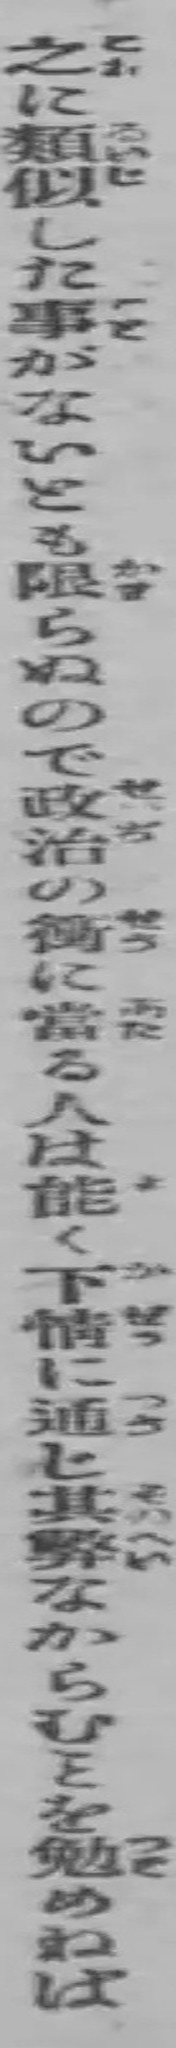之に類似した事がないとも限らぬので政治の衝に当る人は能く下情に通じ其弊なからむことを勉めねば
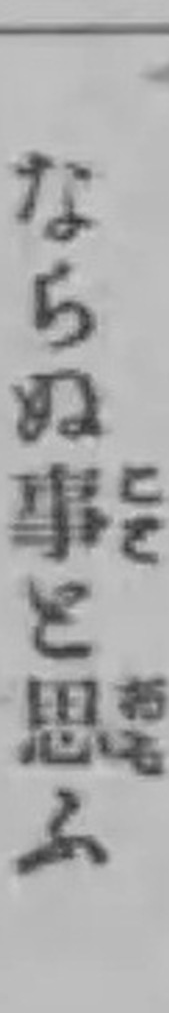ならぬ事と思ふ
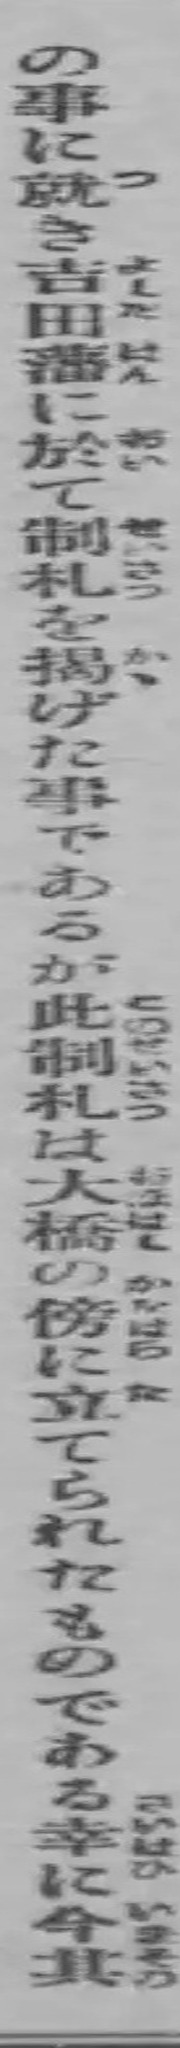の事に就き吉田藩に於て制札を掲げた事であるが此制札は大橋の傍に立てられたものである幸に今其
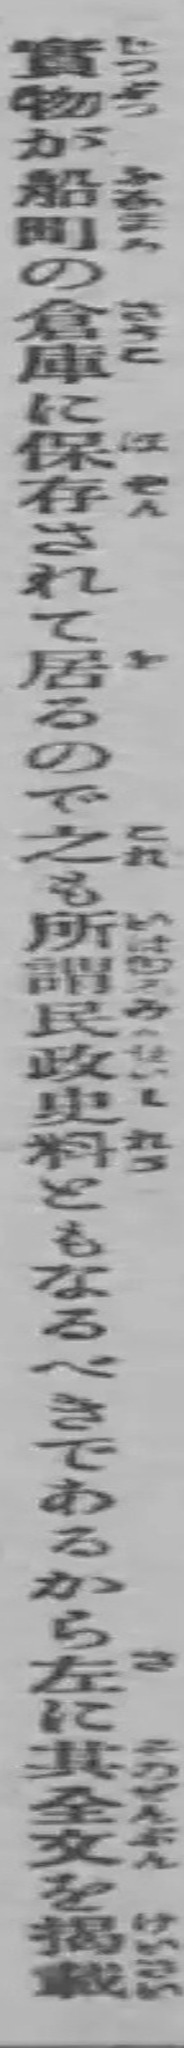実物が船町の倉庫に保存されて居るので之も所謂民政史料ともなるべきであるから左に其全文を掲載
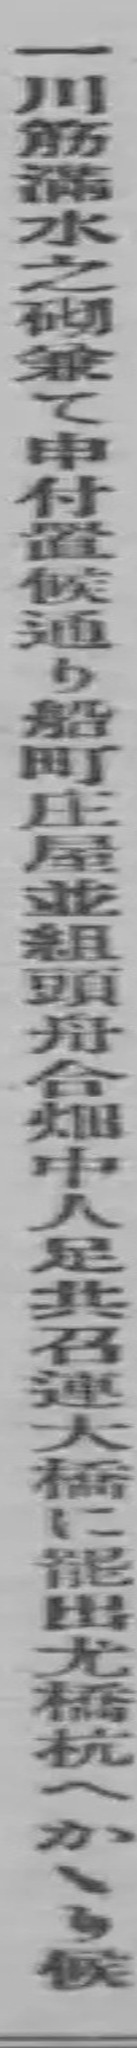一川筋満水之砌兼て申付置候通り船町庄屋並組頭舟合畑中人足共召連大橋に罷出尤橋杭へかゝり候
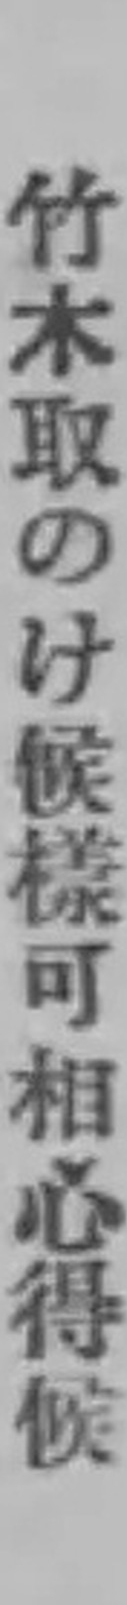竹木取のけ候様可相心得候
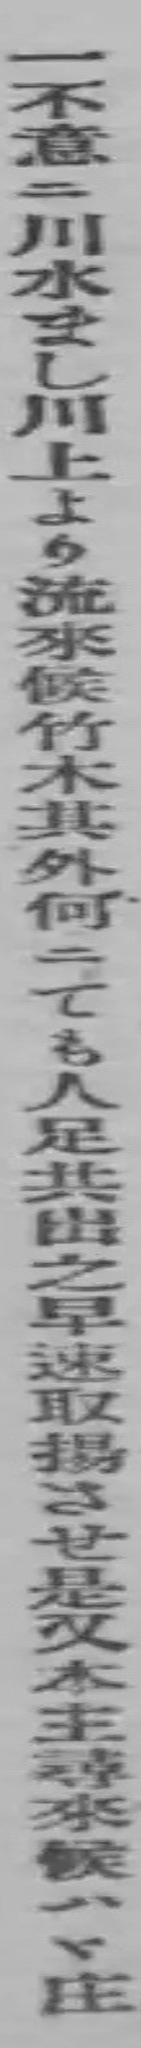一不意ニ川水まし川上より流来候竹木其外何ニても人足共出之早速取揚させ是又本主尋来候ハヾ庄
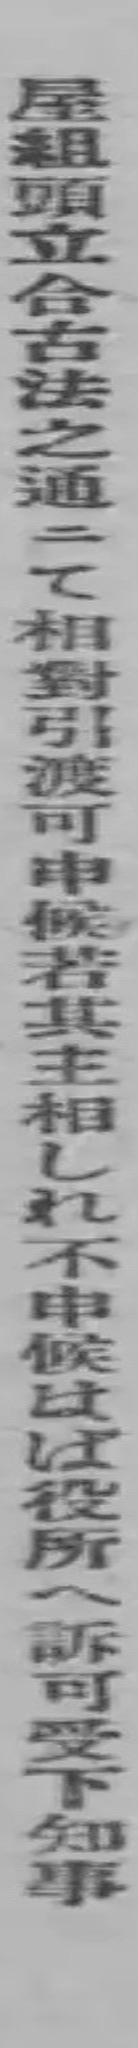屋組頭立合古法之通ニて相対引渡可申候若其主相しれ不申候はば役所へ訴可受下知事
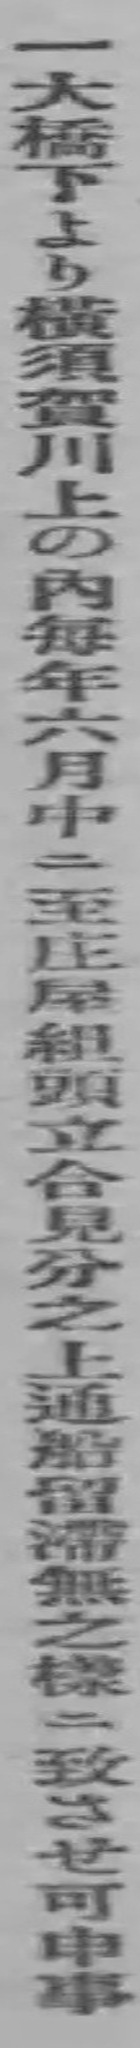一大橋下より横須賀川上の内毎年六月中ニ至庄屋組頭立合見分之上通船留滞無之様ニ致させ可申事
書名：豊橋市史談
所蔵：国立国会図書館 National Diet Library, JAPAN
